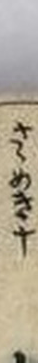さゝめき十
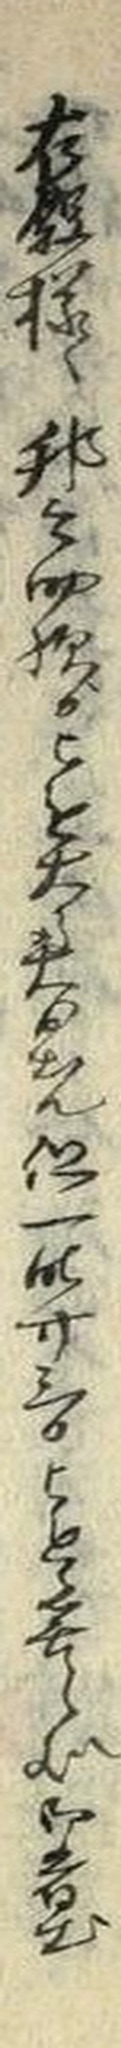右殿様へ邦之助様ゟ被進大奥ゟ出ル但一昨廿三日被進候筈之処御肴出
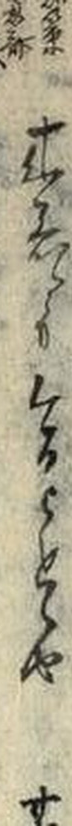来兼候ニ付今日被進候由
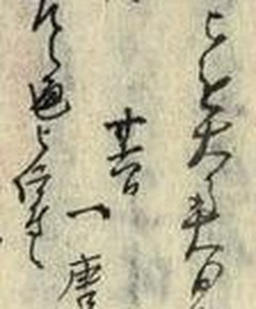廿六日
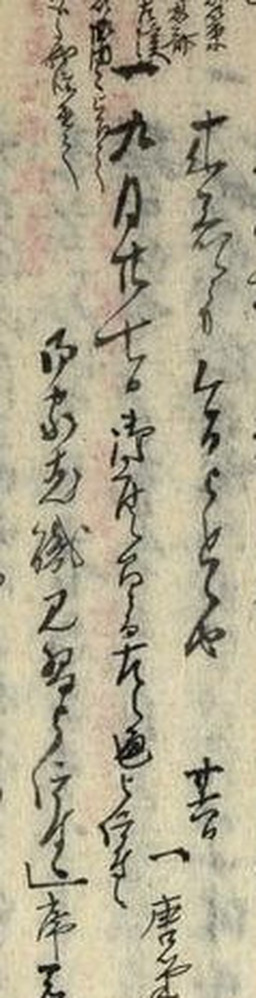一九月廿七日御座之間ニ而左之通被仰付候
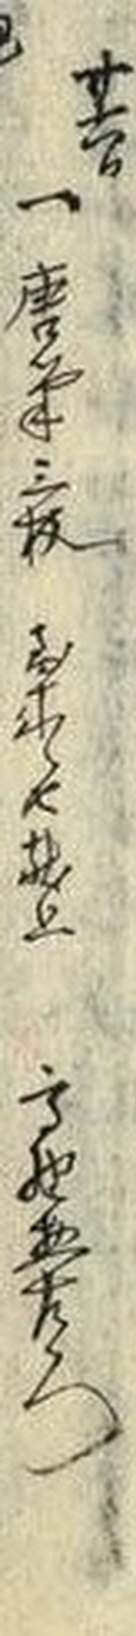一唐筆三枚到来之由献上高野惣左衛門
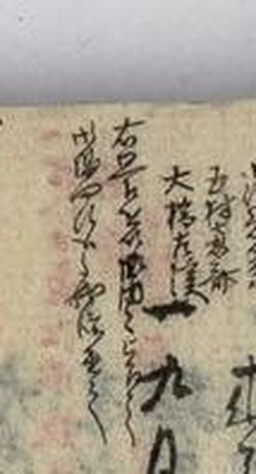右思召を以御内々被下之
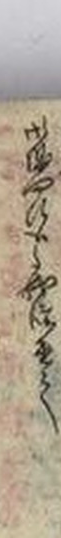御側向頭取手紙添遣之
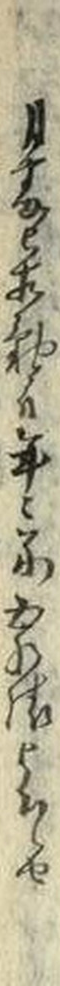月番被相勤候ニ付年々米五拾俵被下候由同人
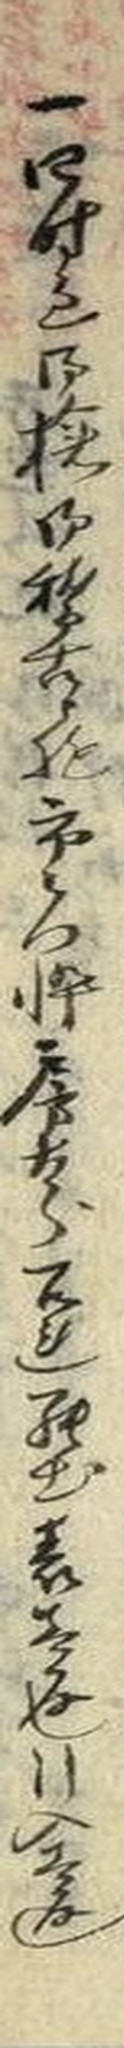一四時過御槍御稽古被遊市右衛門忰房太郎召連罷出表壱通引入壱通
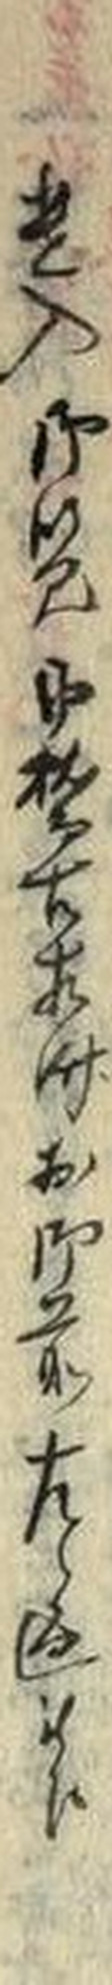遣入御覧御稽古相済於御前左之通被下

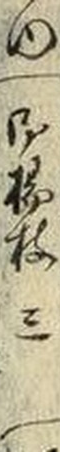御楊枝三
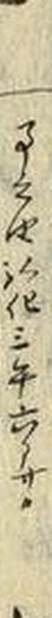事之由弘化三午六月廿日
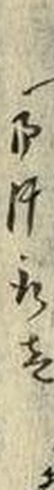御汗取壱
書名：少傅日録抄（斉承付側向頭取日記、在国）
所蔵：福井県文書館 Fukui Prefectural Archives
